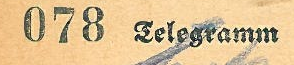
078 Telegramm
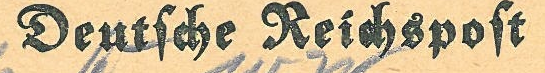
Deutsche Reichspost
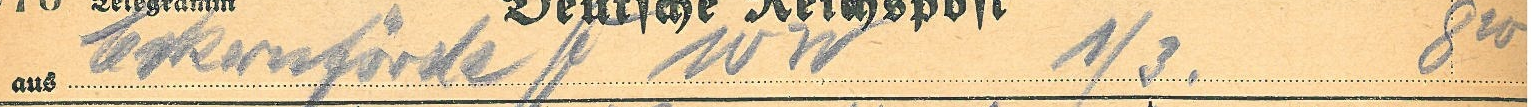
Eckernförde, WW 1/3. 820
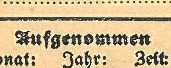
Aufgenommen:
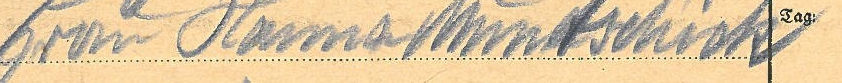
Frau
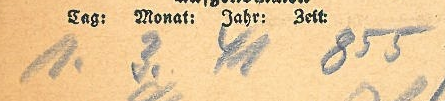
1.3.41. 855
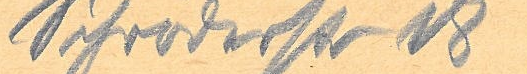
Schröstraße 18
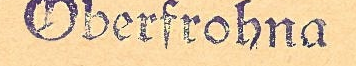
O.
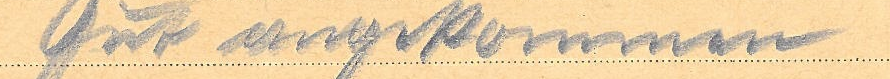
gut angekommen
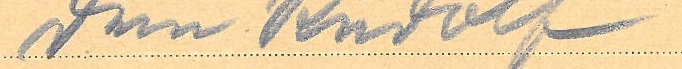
Dein Rudolf
